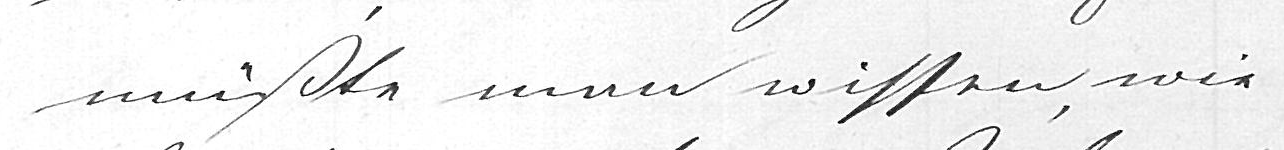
müßte man wissen, wie
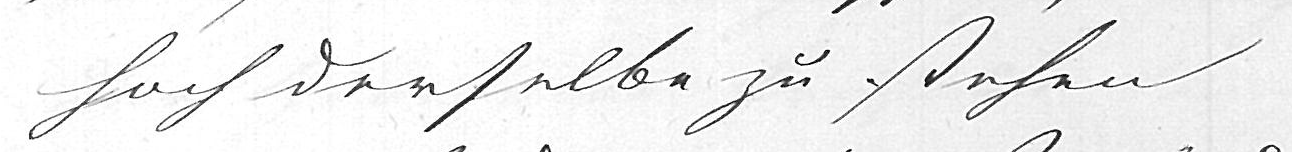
hoch derselbe zu stehen
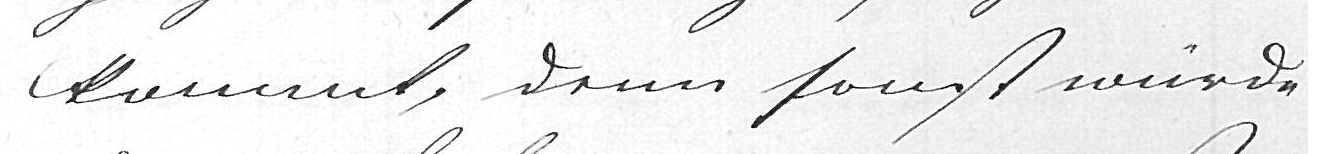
kommt, denn sonst würde
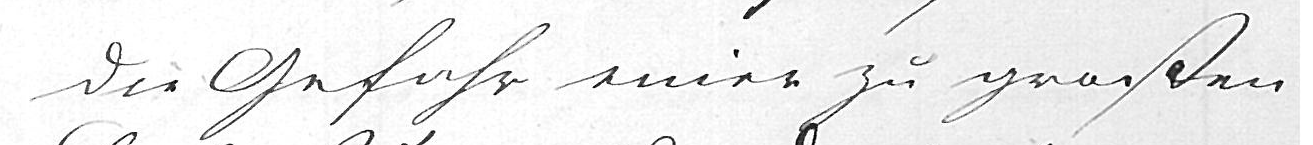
die Gefahr einer zu großen
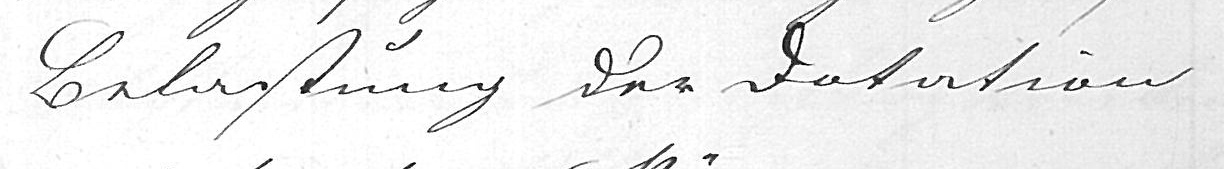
Belastung der Dotation
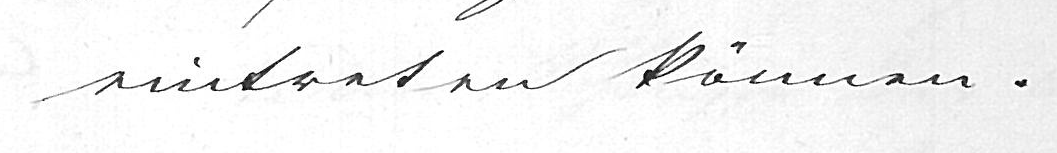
eintreten können.
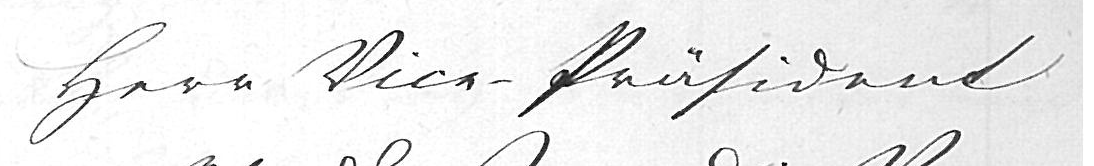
Herr Vice-Präsident
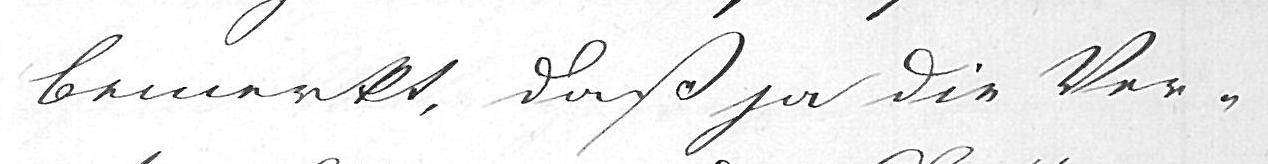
bemerkt, daß ja die Ver-
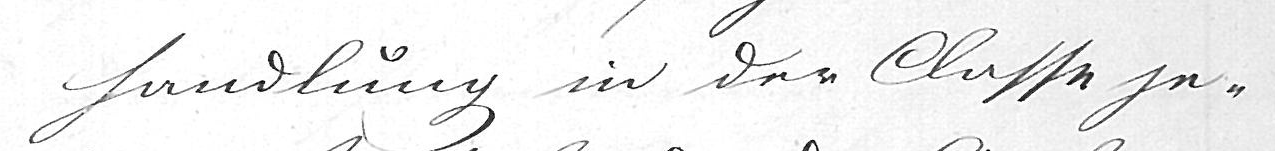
handlung in der Classe je-
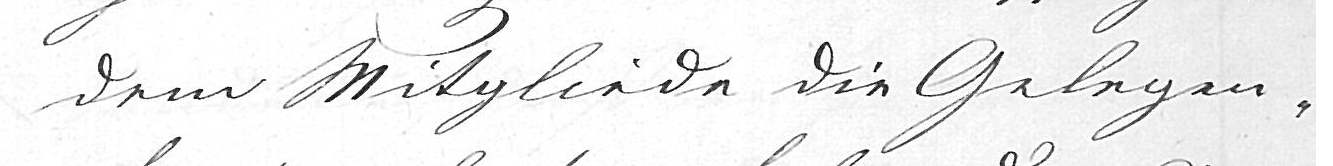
dem Mitgliede die Gelegen-
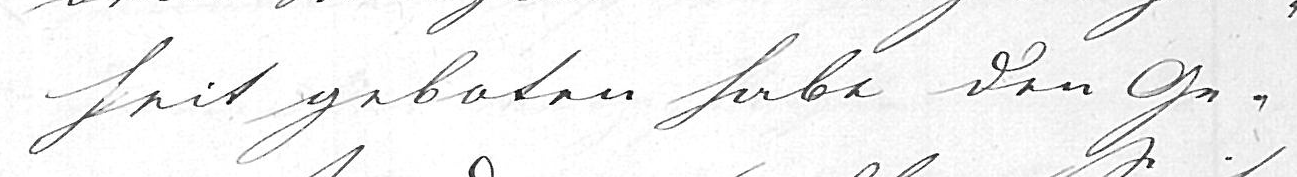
heit geboten habe den Ge-
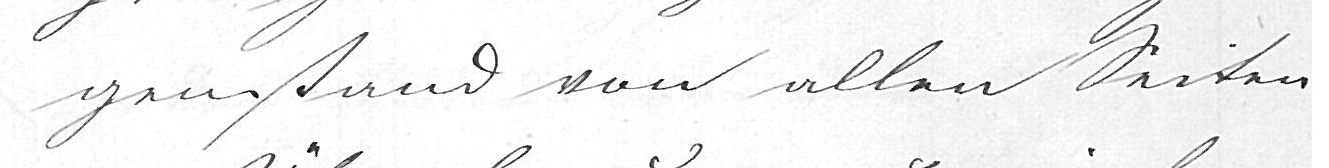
genstand von allen Seiten
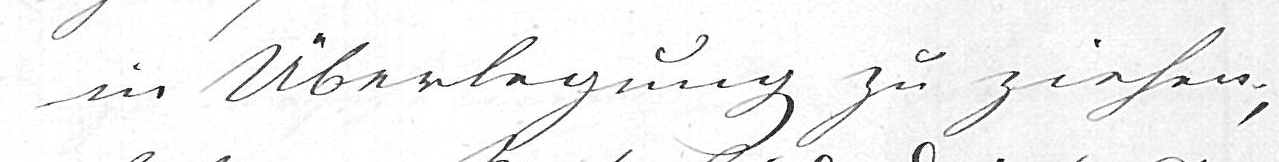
im Überlegung zu ziehen,
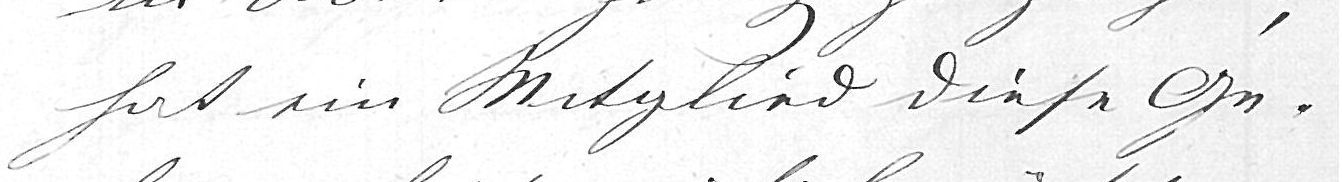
hat ein Mitglied diese Ge-
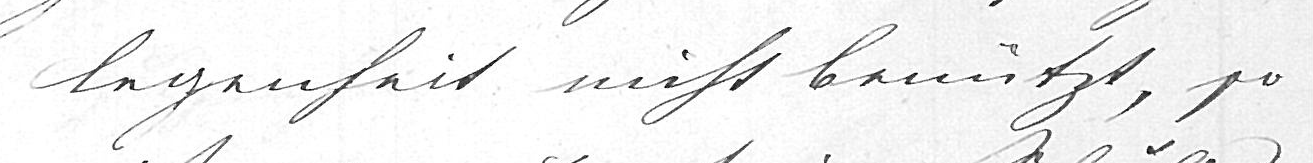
legenheit nicht benützt, so
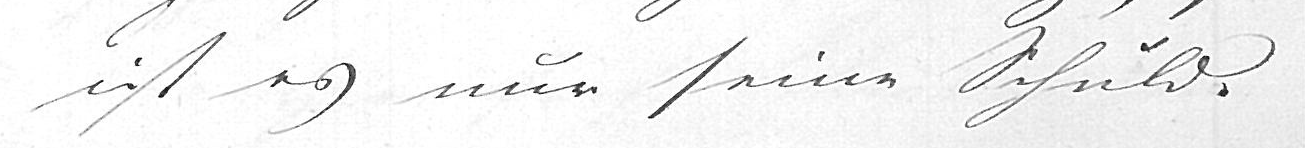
ist es nur seine Schuld.
